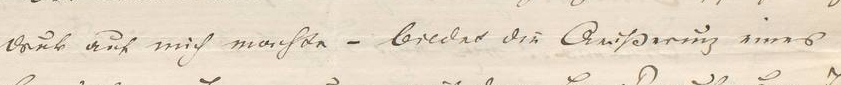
druk auf mich machte – bildet die Aeußerung eines
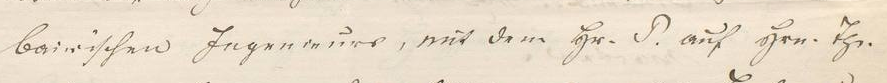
bairischen Ingenieurs, mit dem Hr. P. auf Hrn. Th.
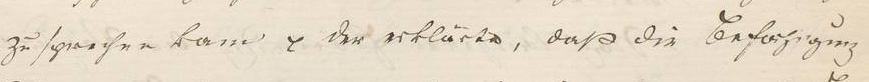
zu sprechen kam & der erkärte, daß die Befähigung
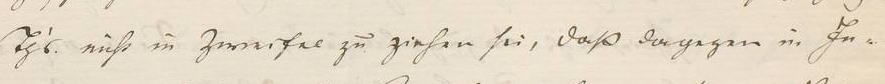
Th's. nicht in Zweifel zu ziehen sei, daß dagegen in In-
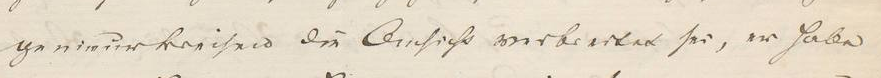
genieurkreisen die Ansicht verbreitet sei, er habe
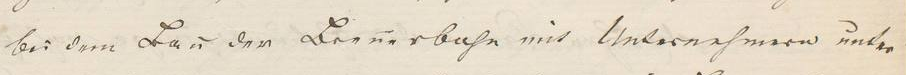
bei dem Bau der Brennerbahn mit Unternehmern unter
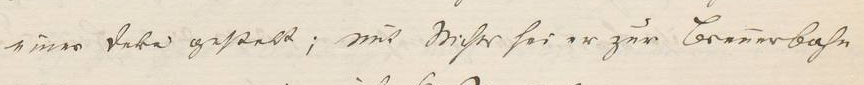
einer Deke gestekt; mit Nichts sei er zur Brennerbahn
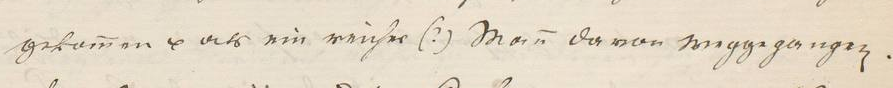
gekommen & als ein reicher (?) Mann davon weggegangen.
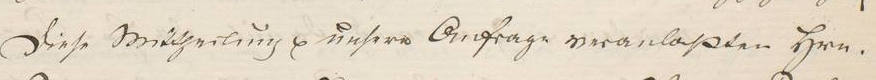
Diese Mittheilung & unsere Anfrage veranlaßten Hrn.
